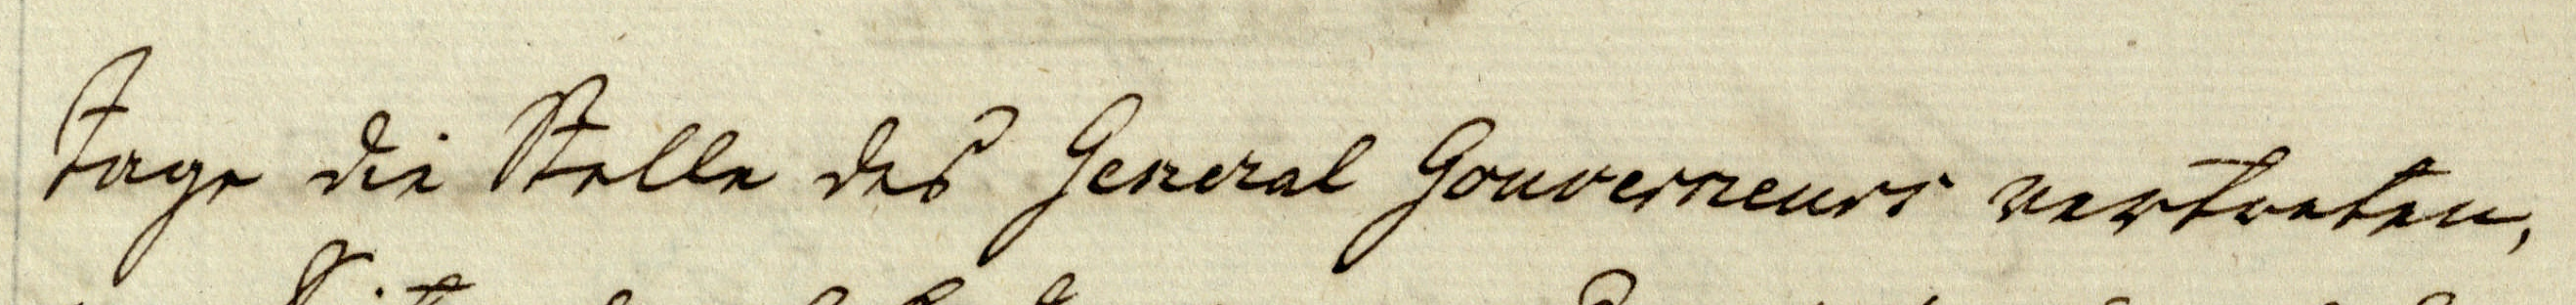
Tage die Stelle des General Gouverneurs vertreten,
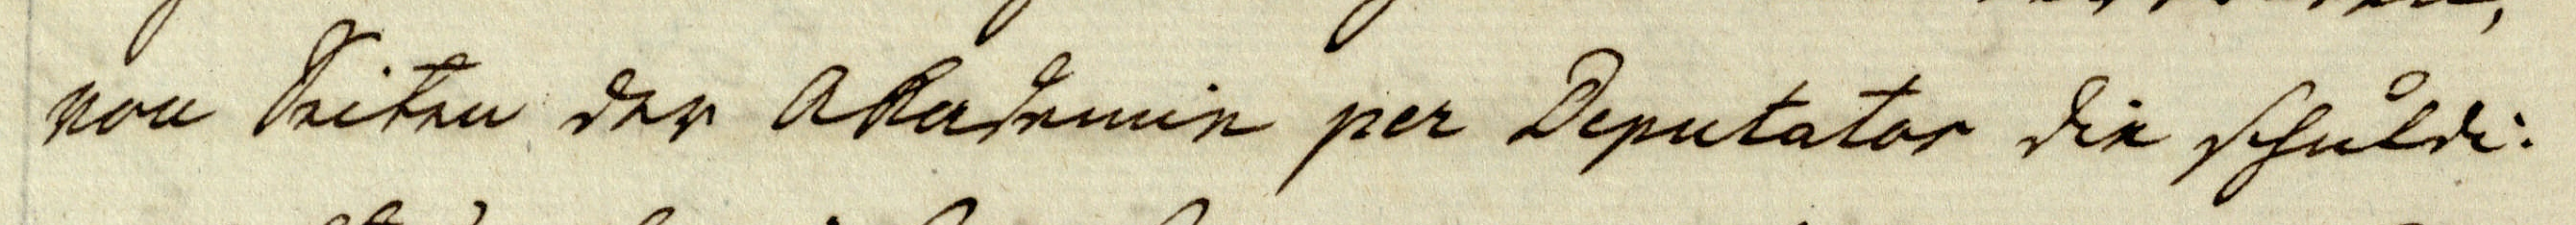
von Seiten der Akademien per Deputatos die schuldi¬
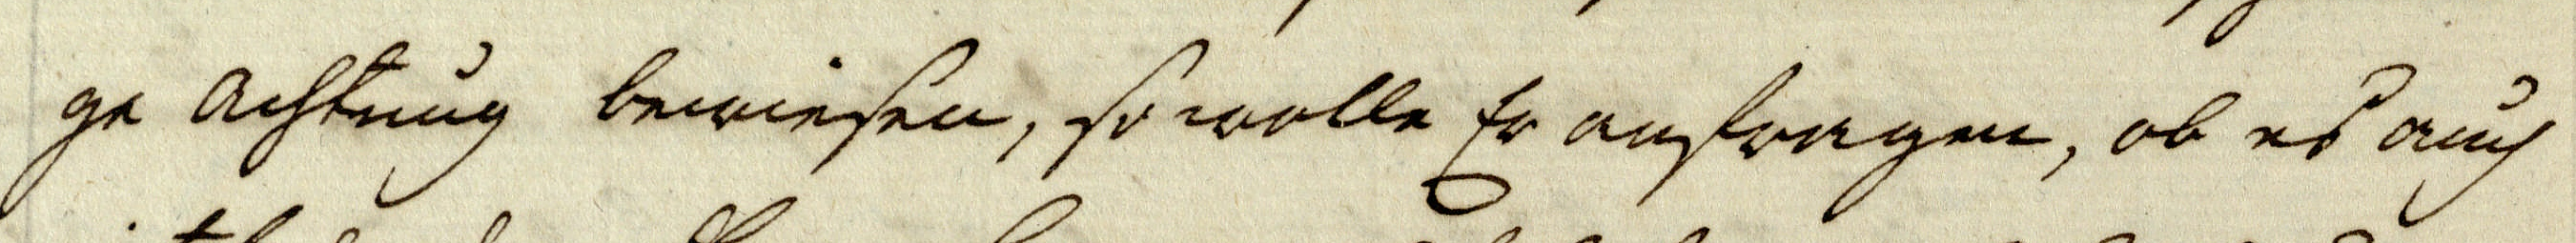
ge Achtung bewiesen, so wolle Er anfragen, ob es auch
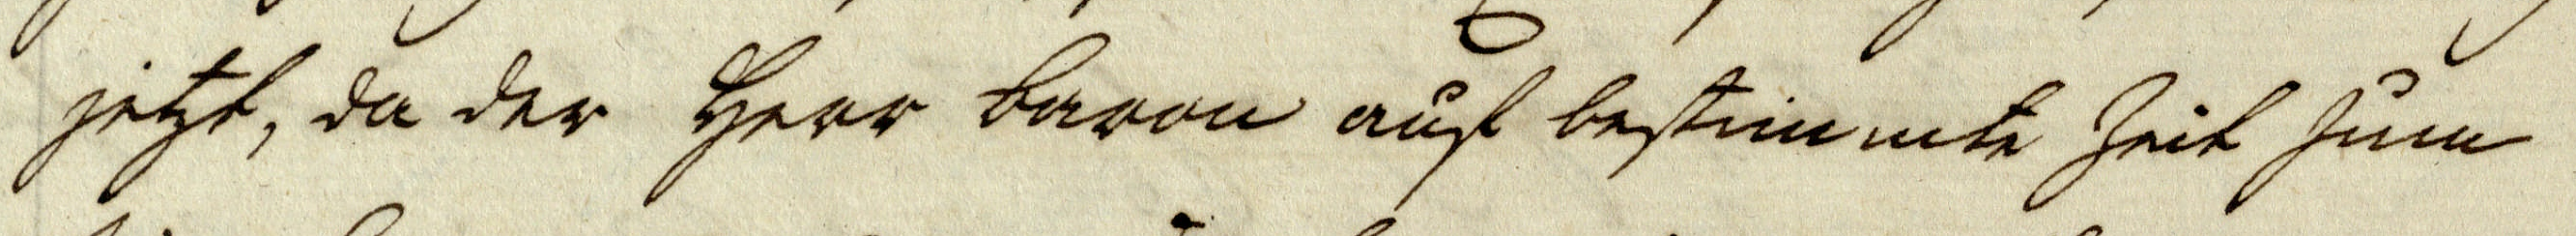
jetzt, da der Herr Baron auf bestimmte Zeit zum
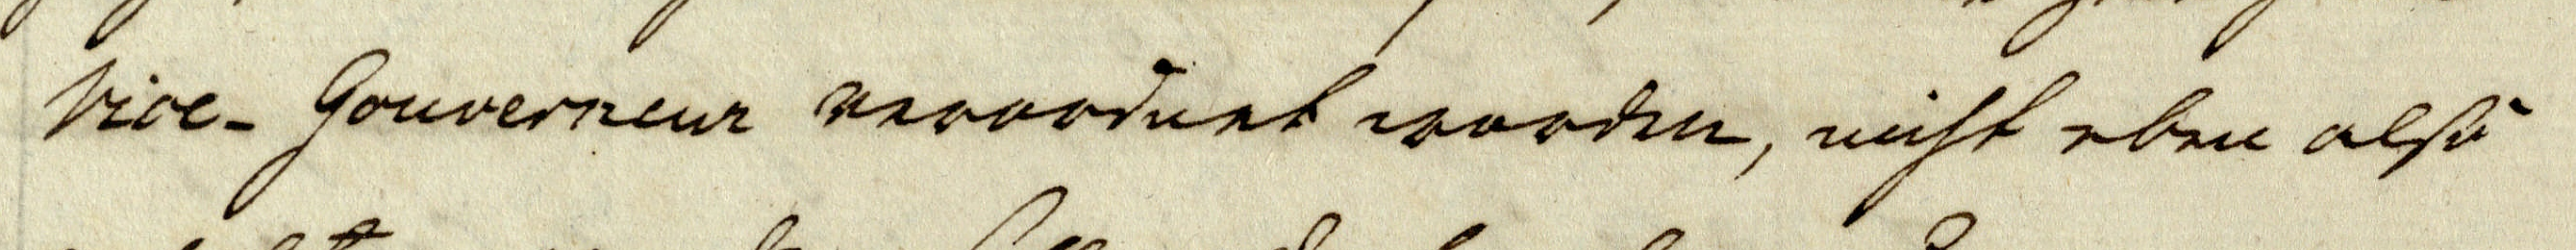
Vice Gouverneur verordnet worden, nicht eben also
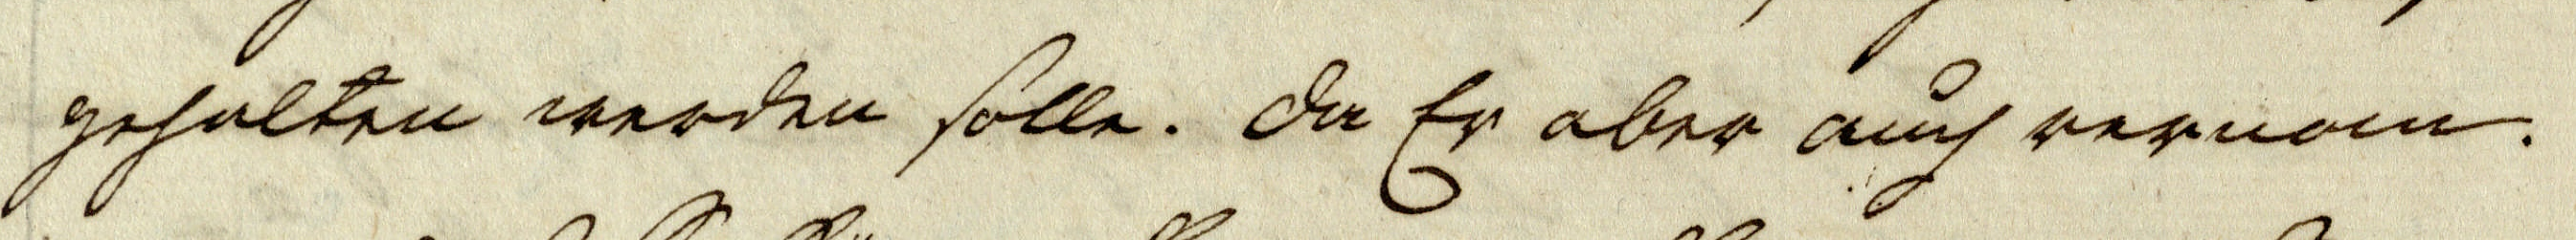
gehalten werden solle. Da Er aber auch vernom¬
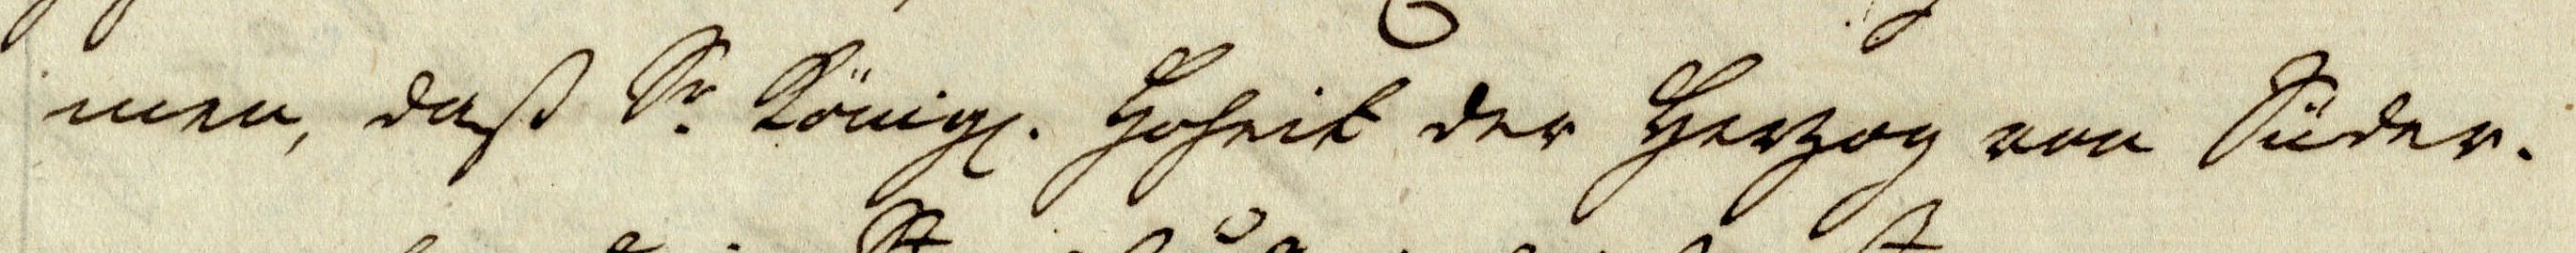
men, daß Sr Königl. Hoheit der Herzog von Süder¬
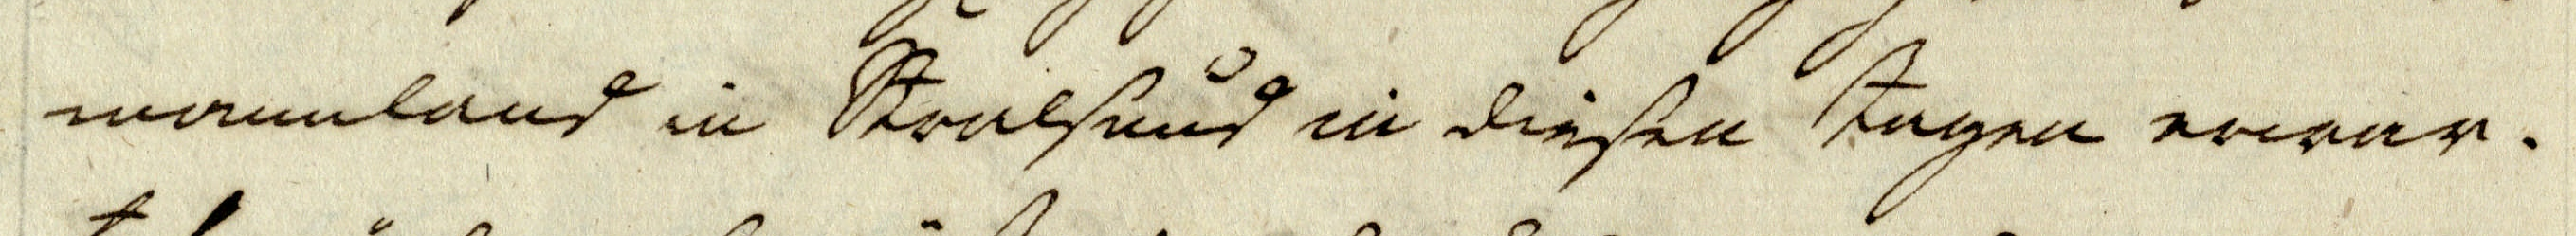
mannland in Stralsund in diesen Tagen erwar-
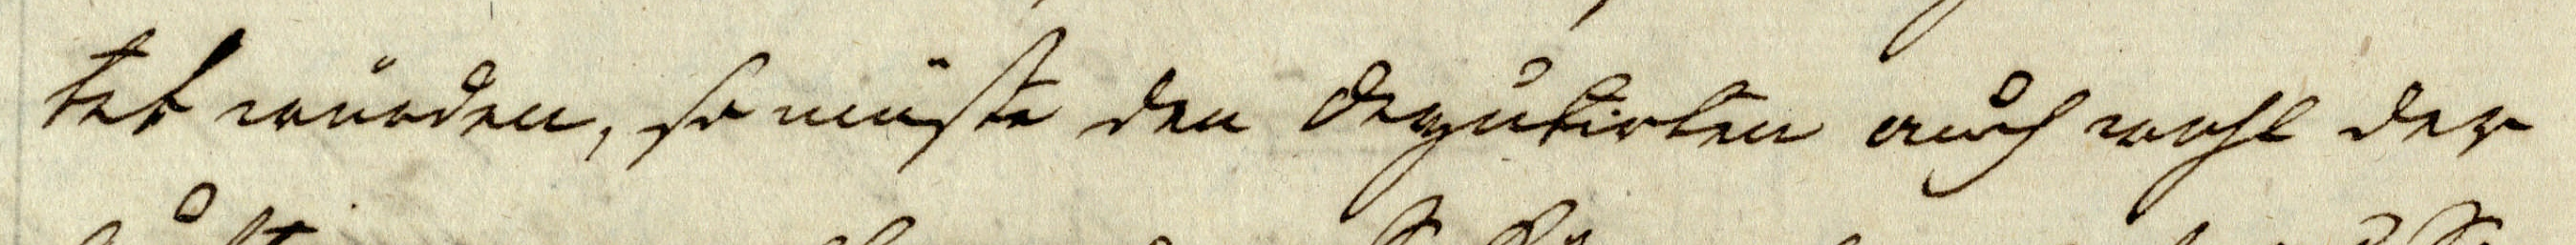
tet würden, so müßte den Deputirten auch wohl der
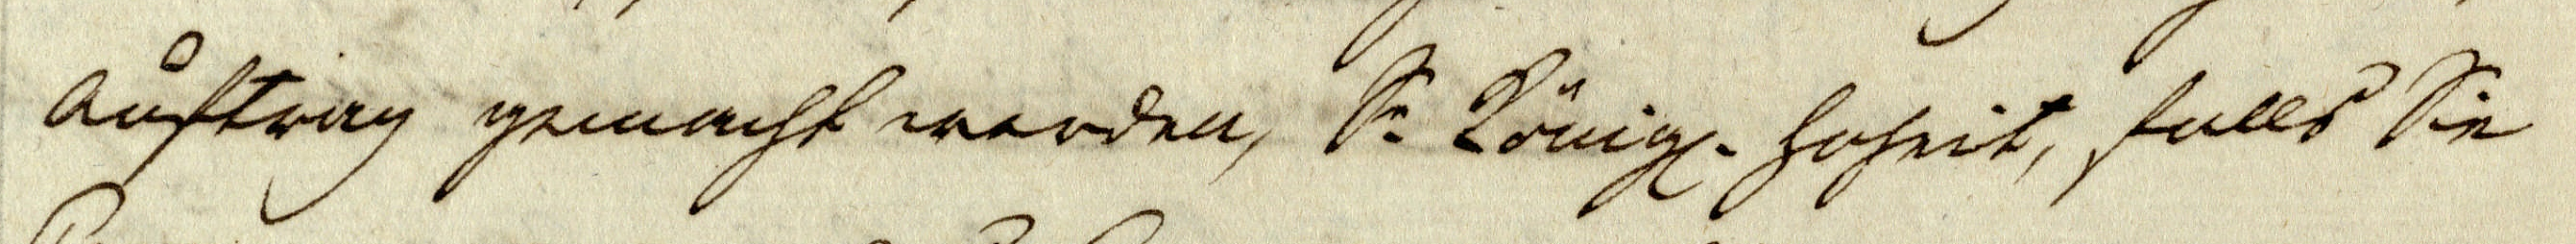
Auftrag gemacht werden, Sr Königl. Hoheit, falls Sie
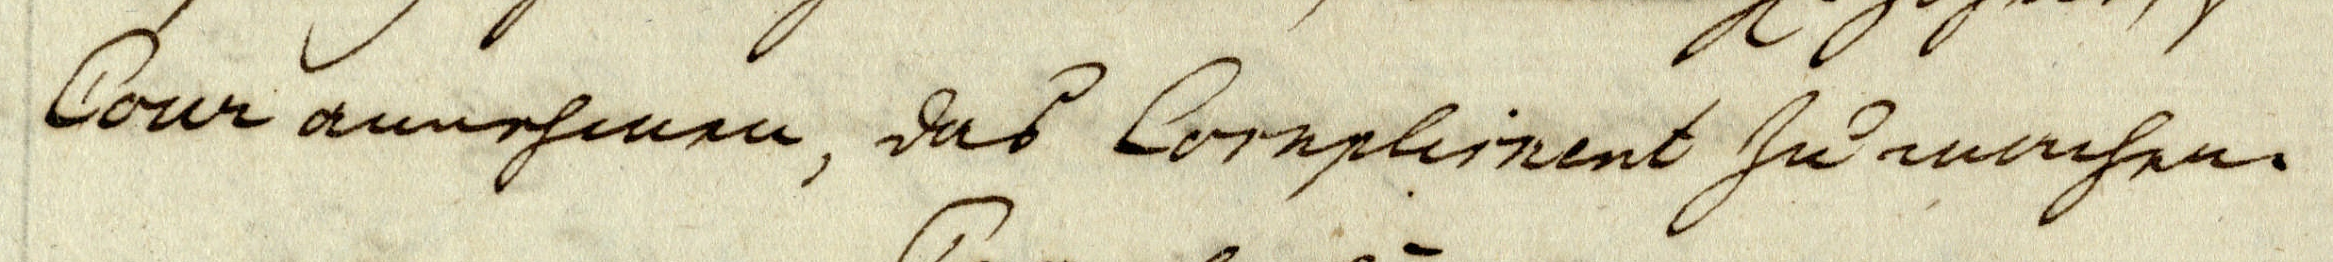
Cour annehmen, das Compliment zu machen.
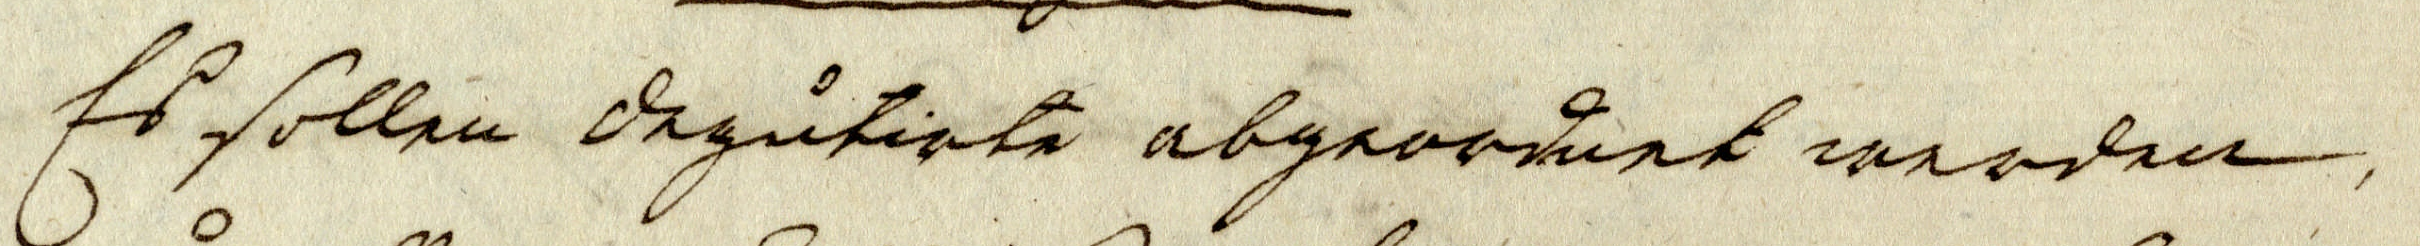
Es sollen Deputirte abgeordnet werden,
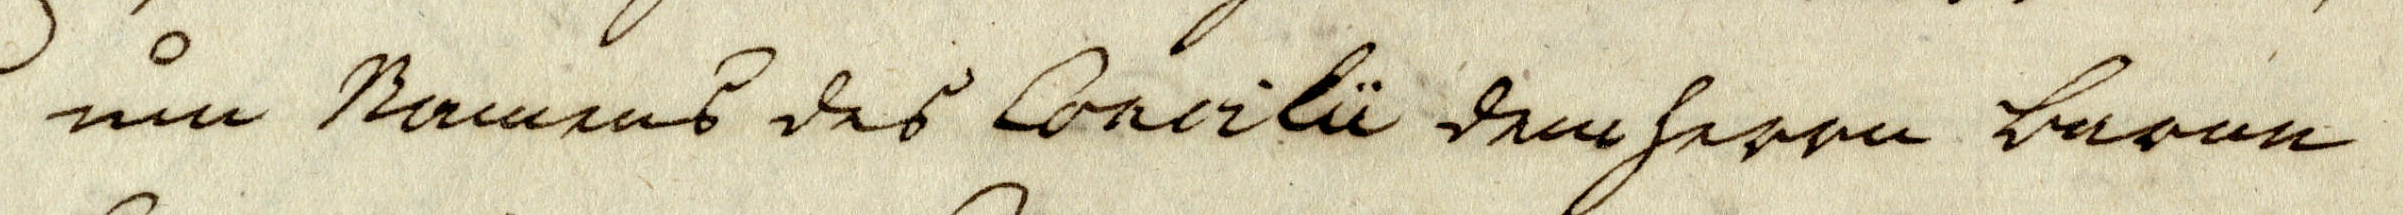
um Namens des Concilii dem Herrn Baron
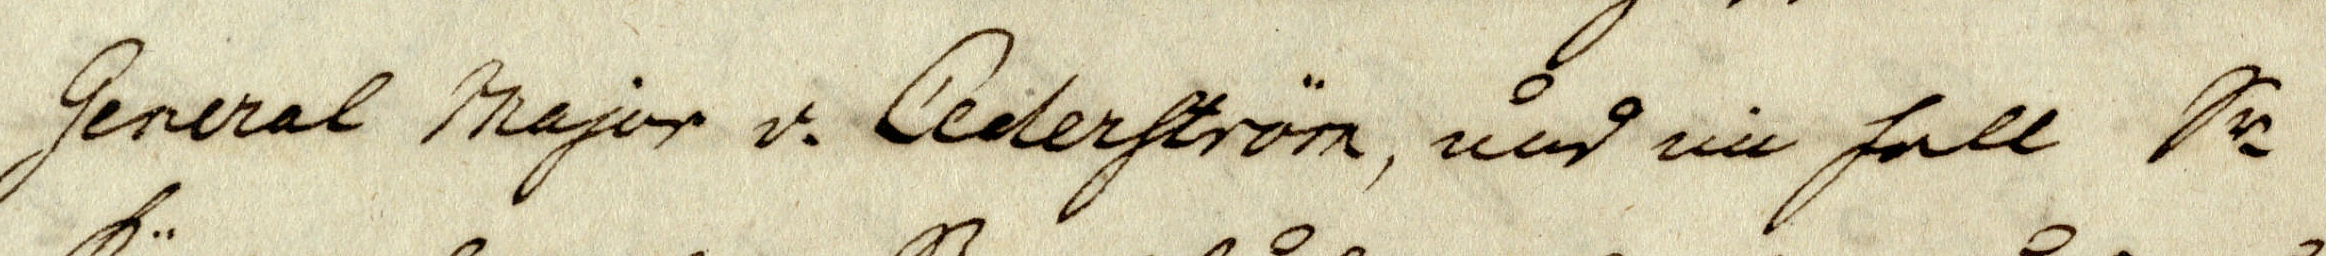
General Major v. Cederström, und im Fall Sr
